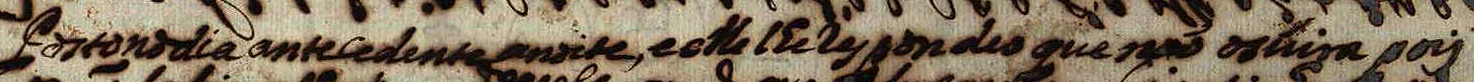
Posto no dia antecedente a noite, e elle lhe Respondeo que naõ os uira pois
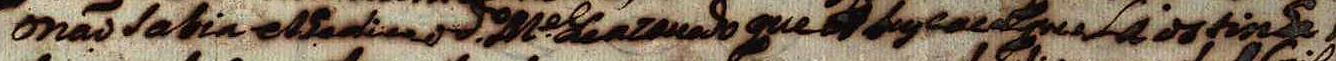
o naõ sabia e lhe dice o d.o M.el de azeuedo que os buscace que o Lá os tinha
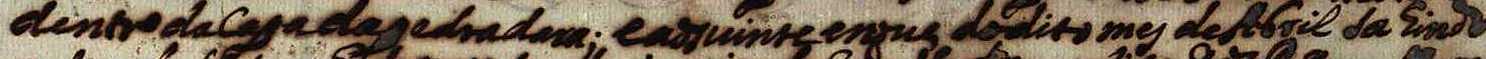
dentro da capa da pedra dara; e aos uinte e noue do dito mes de Abril sahindo
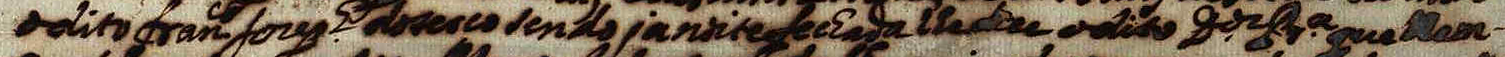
o dito franco Jozeph do terço sendo ja noite fechada lhe dice o dito D.oz Pr.a que Nam
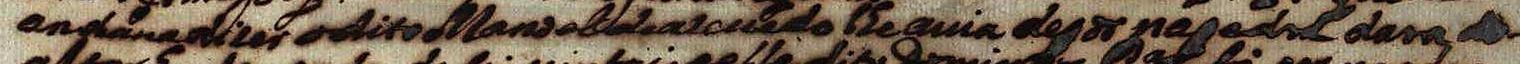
andaua dizer o dito Manoel de azeuedo lhe auia de por na pedra dara
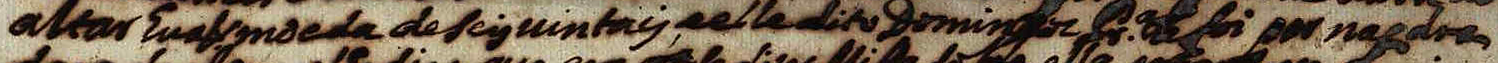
altar huā moeda de seis uintais, e elle dito Domingoz Pr.a se foi por na pedra
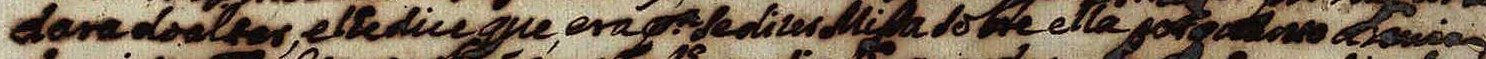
dara do altar, e lhe dice que, era p.a se dizer Misa sobre ella porqu_nto hauia
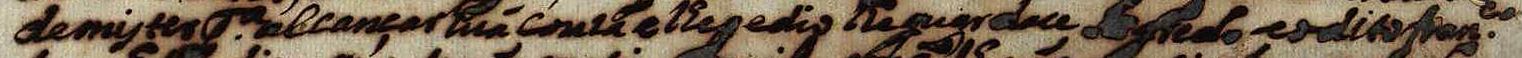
de mister p.a alcançar huā couza e lhe pedio lhe guardace segredo e o dito fran.co
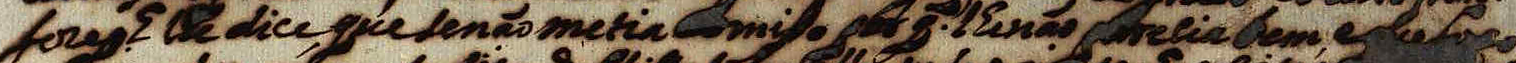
Jozeph lhe dice, que se não metia Com iso por q. lhe não parecia bem, e que Logo
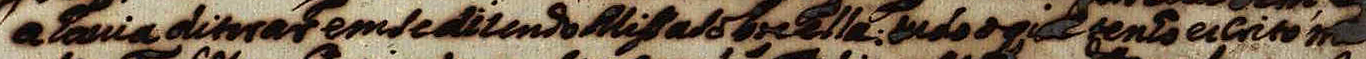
a hauia di tirar em se dizendo Missa sobre ella: tudo o que tenho escrito m
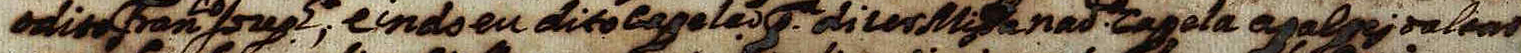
o dito Franco Jozeph; e indo eu dito capelaõ p.a dizer Missa na d.a capela apalpej o altar
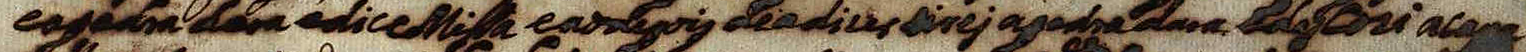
e a pedra dara e dice Missa e ao depois de a dizer tirej a pedra dara e desCozi a capa
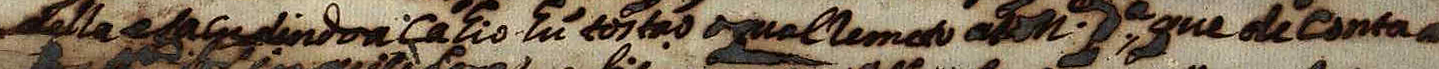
della e sacudindoa cahio hū tostaõ o qual Remeto a v m.ce p.a que de conta
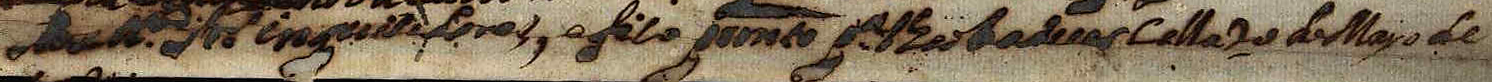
sr.s inquisidores, e fico pronto p.a lhe obedecer Cella 20 de Mayo de
